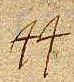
44
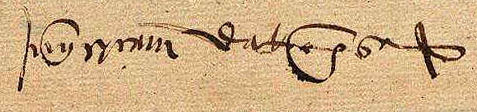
Jnq̄ryçam da Re p̄sa
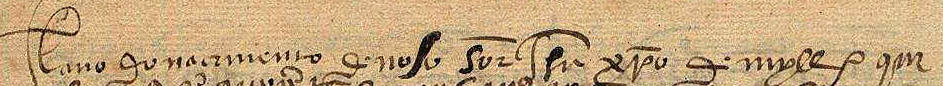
Anno do nacimento de noso S̄or Jhū xp̄o de myll e qui
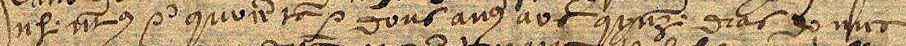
nhentꝯ e quorēta e dous anꝯ aos qynze dias do mes
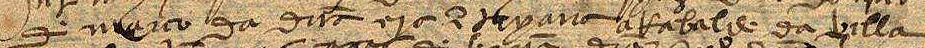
de março da dita era ē tryana aRabalde da villa
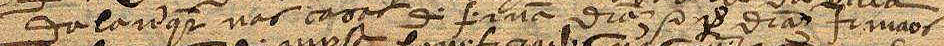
dalanq̄r nas casas de fernā diaz e ꝑo diaz Jrmãos
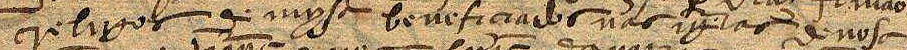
creligos de mysa beneficiados nas iḡeias de nosa
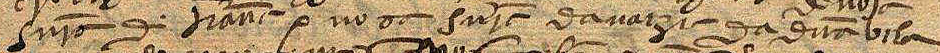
snr̄a de tiāna e nosa snr̄a da uarzia da dita vila
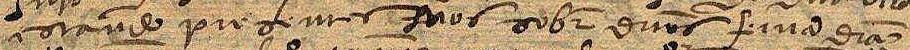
estando presentes hos sobr̄dit̄os fernā diaz
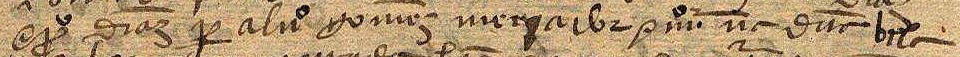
e ꝓo diaz ꝑ aluo gomez mercador e mor na dita vila
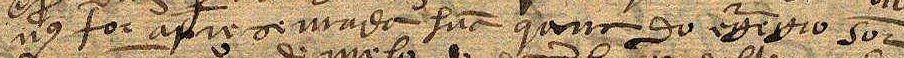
nꝯ foi apresentada huā qarta do eḡegio S̄or
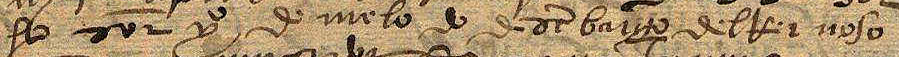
ho s̄or yo de melo do desēbargo del Rei noso
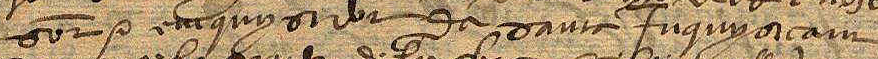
sōr e emquysidor da santa Jnquysiçam
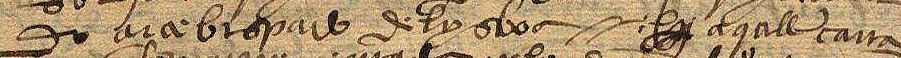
do arcebispado de lysboa // cꝭ a quall carta
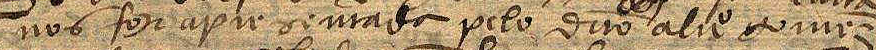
nos foi apresentada pelo dito aluo gomez
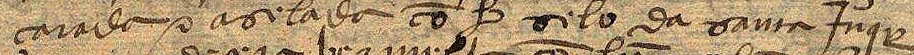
çarada e aselada c̄o ho selo da santa Jnqy
